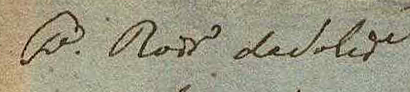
Fr. Rodro da Soled.e
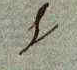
1
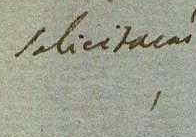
solicitaçaõ
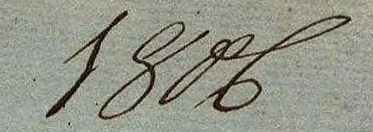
1806
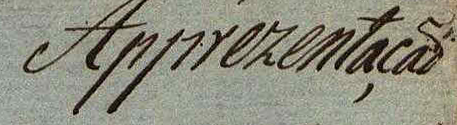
Apprezentaçaõ
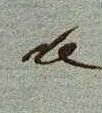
de
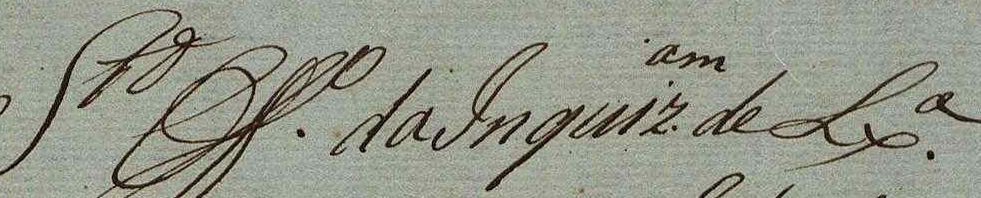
S.to Off.o da Inquiz.am de Lx.a
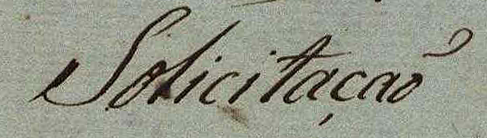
Solicitaçaõ
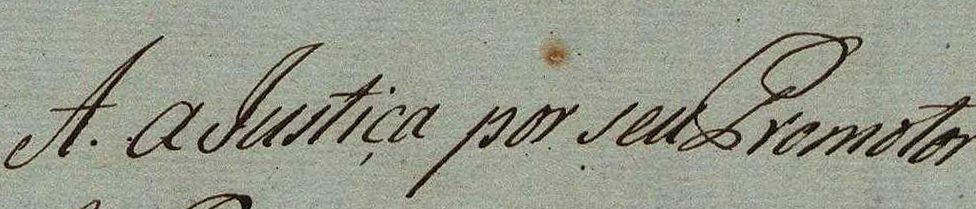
A. a Iustiça por seu Promotor
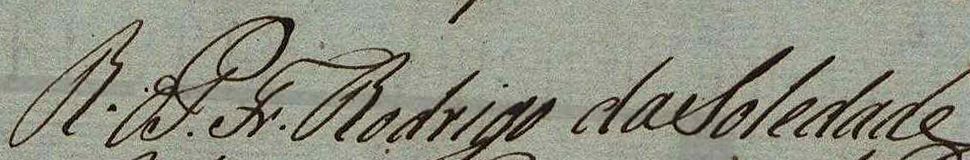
R. P. Fr. Rodrigo da Soledade
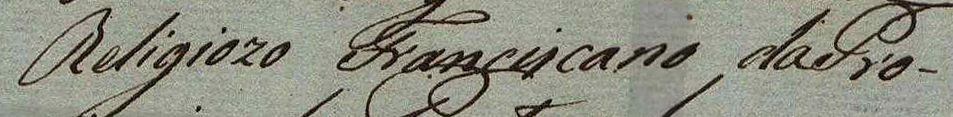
Religiozo Franciscano da Pro
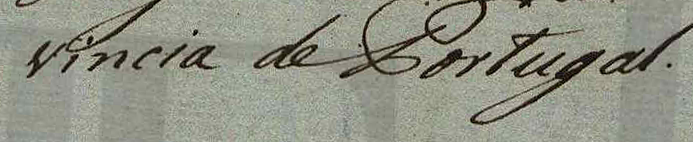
vincia de Portugal.
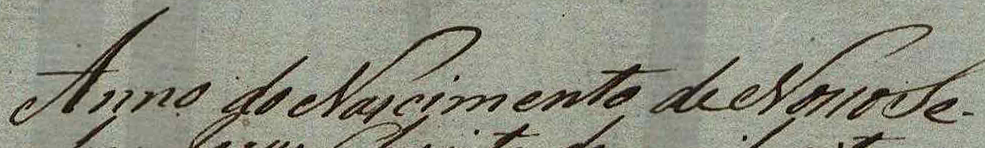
Anno do Nascimento de Nosso Se
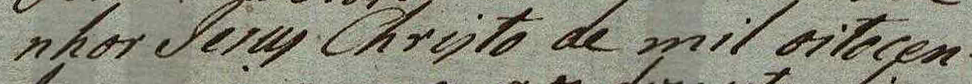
nhor Iesus Christo de mil oitocen
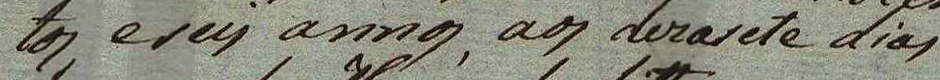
tos e seis annos, aos dezasete dias
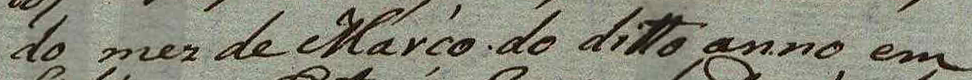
do mez de Março do ditto anno, em
